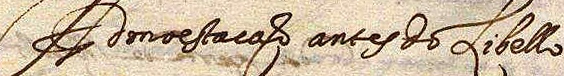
Admoestaçaõ antes do Libello
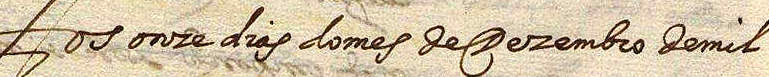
Aos onze dias do mes de Dezembro de mil
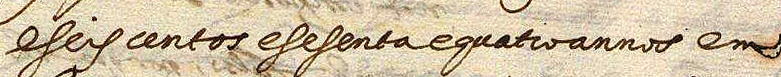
e seiscentos e sesenta e quatro annos em
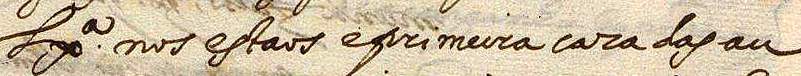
Lx.a nos estaos e primeira caza das au
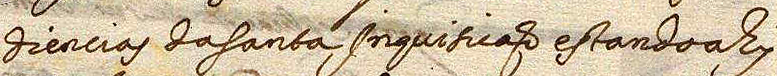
diencias da santa jnquisicaõ estando ahy
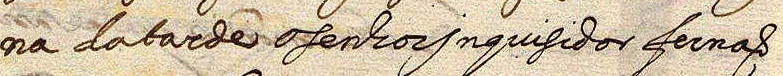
na da tarde o senhor jnquisidor fernaõ
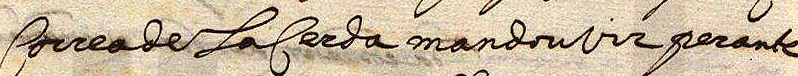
Correa de LaCerda mandou vir perante
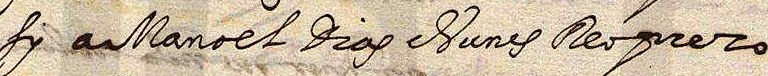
sy a Manoel Dias Nunes Reo prezo
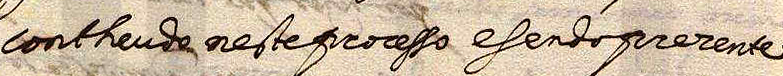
contheudo neste processo e sendo prezente
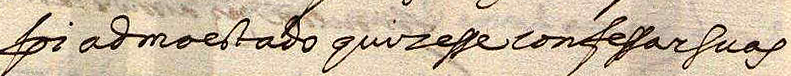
foi admoestado quizesse confessar Suas
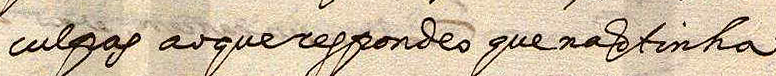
culpas ao que respondeo que naõ tinha
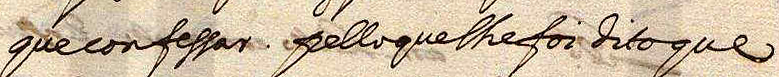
que confessar. pello que lhe foi dito que
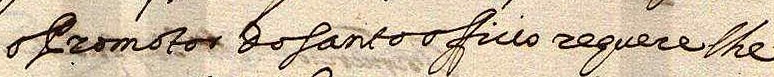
o Promotor do santo officio requerelhe
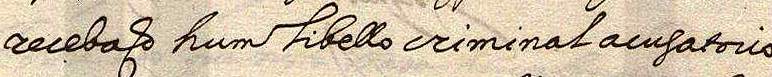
recebaõ hum Libello criminal acusatorio
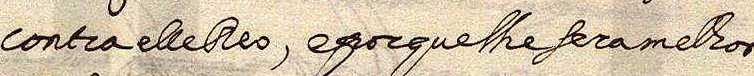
contra elle Reo, e porque lhe sera melhor
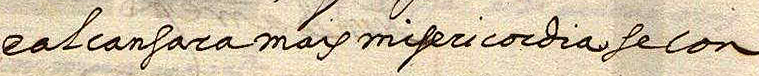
e alcansara mais misericordia se con
